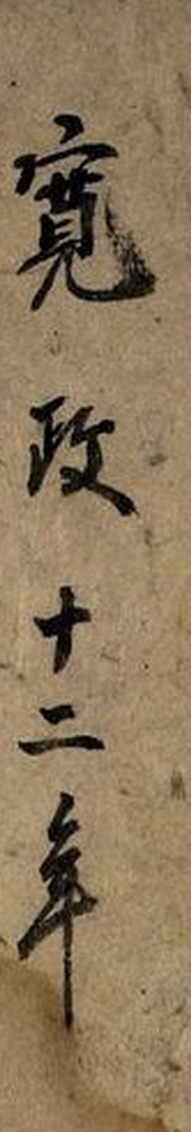寛政十二年
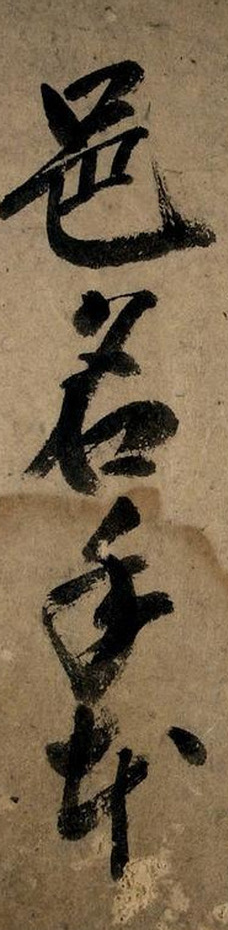邑名手本

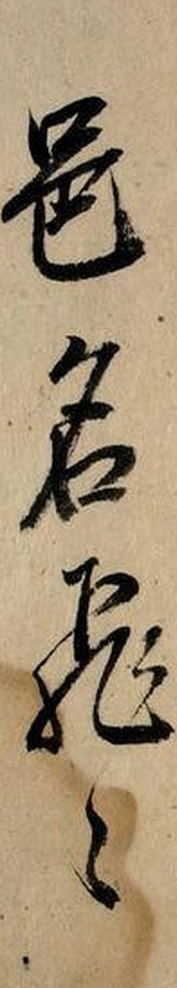邑名飛々

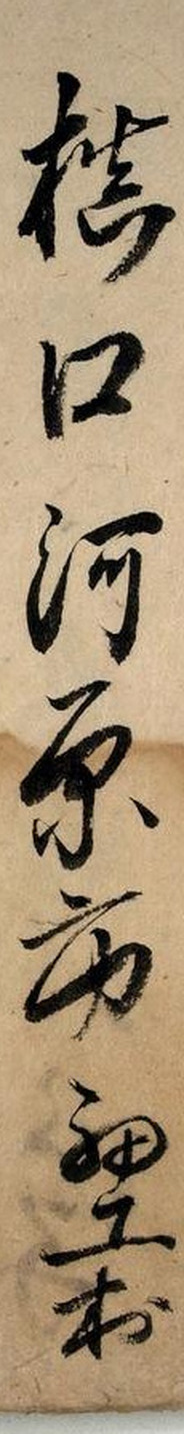槙口河原市細工村
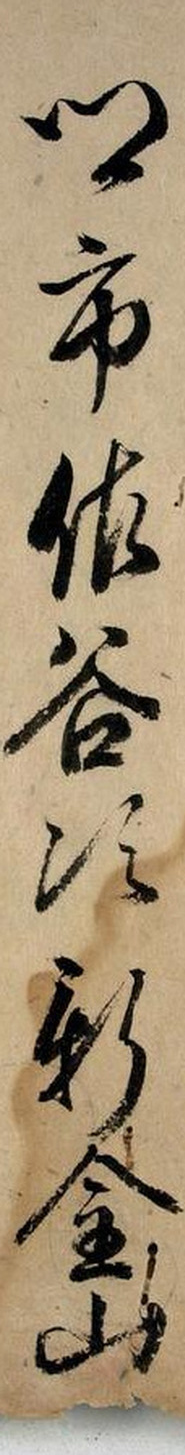郷市佐谷次新金山
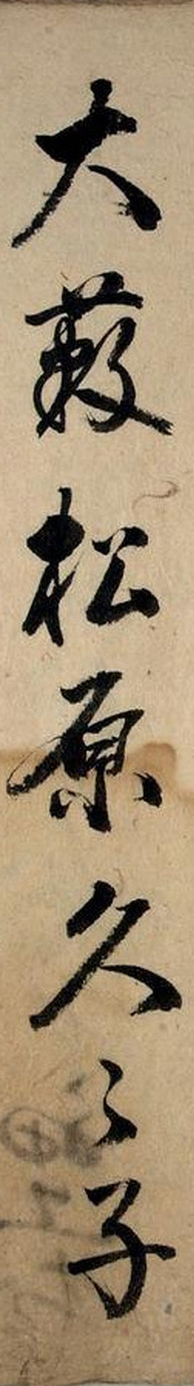大藪松原久々子
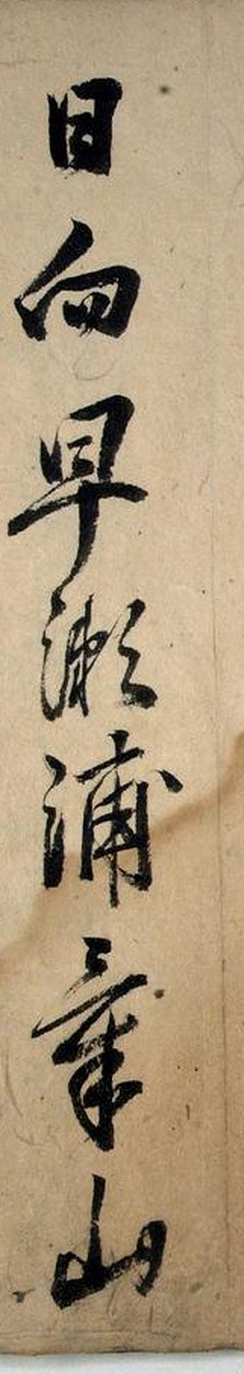日向早瀬浦気山

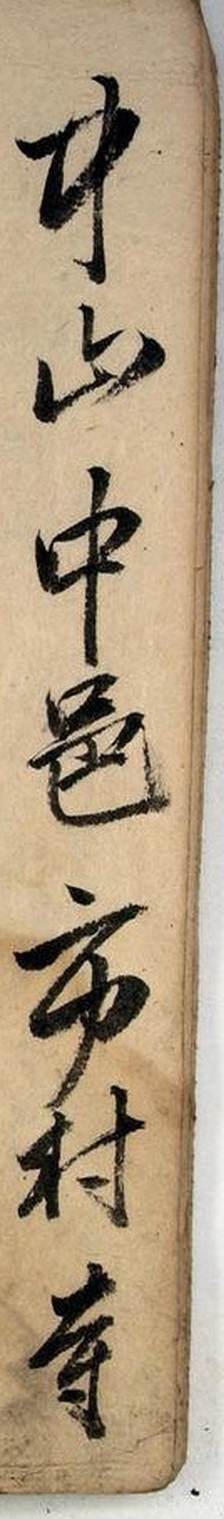中山中邑市村寺】
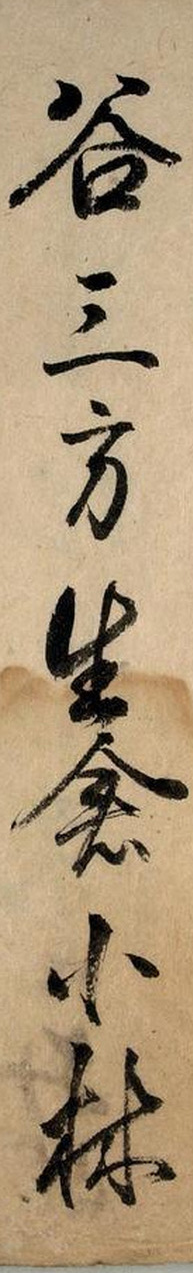谷三方生倉小林
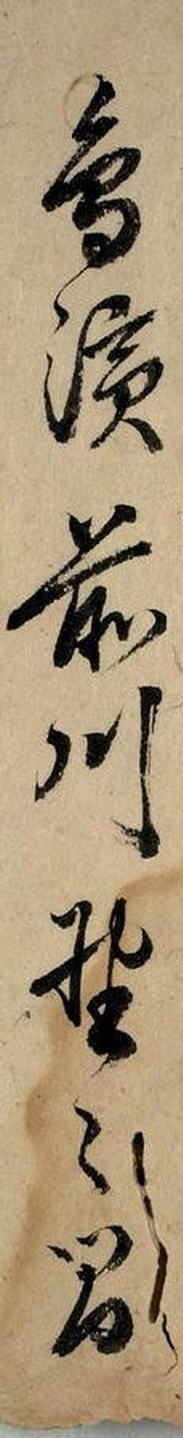鳥浜前川野々間
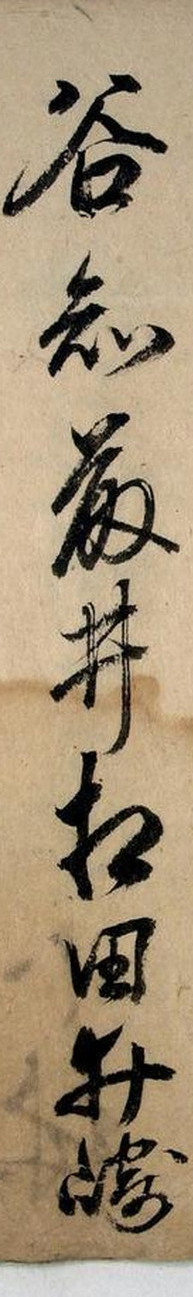谷知藤井相田井崎
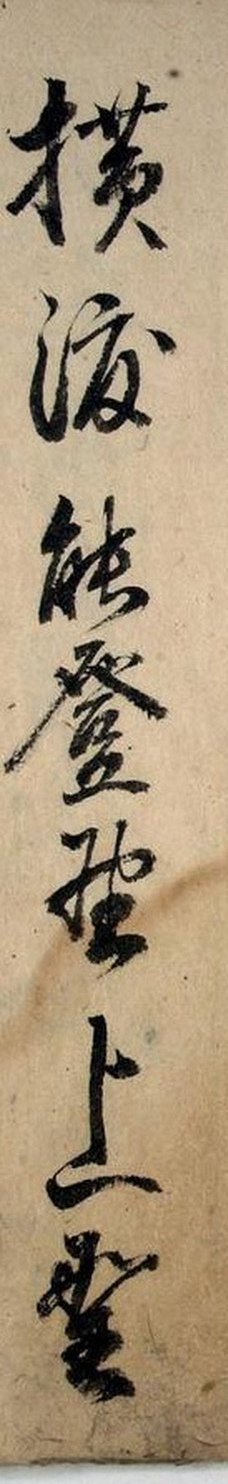横渡能登野上野

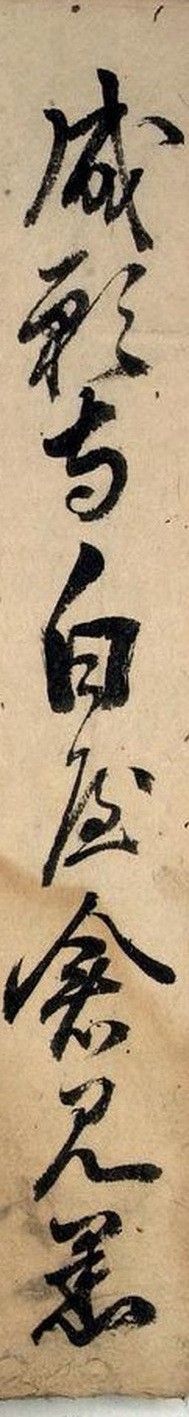成願寺白屋倉見黒
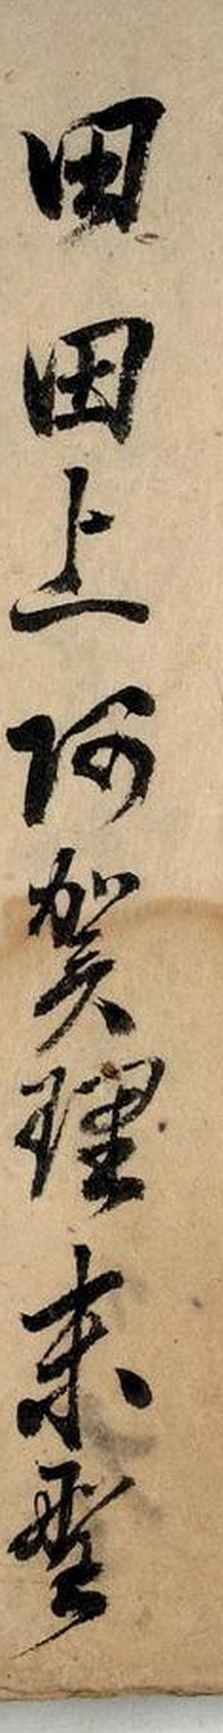田田上阿賀理末野
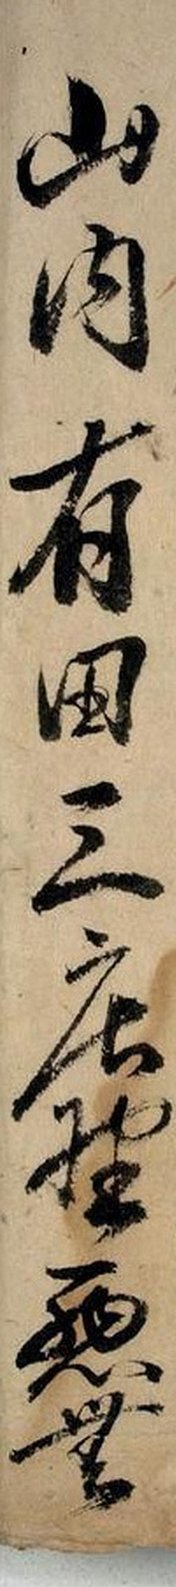山内有田三庄野悪無
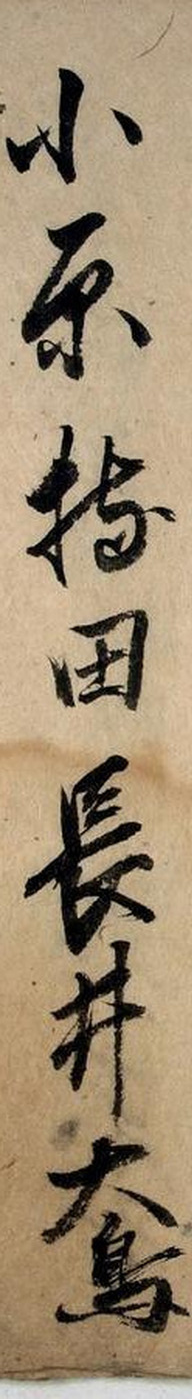小原持田長井大鳥
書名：邑名手本（手習）
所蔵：福井県文書館 Fukui Prefectural Archives
